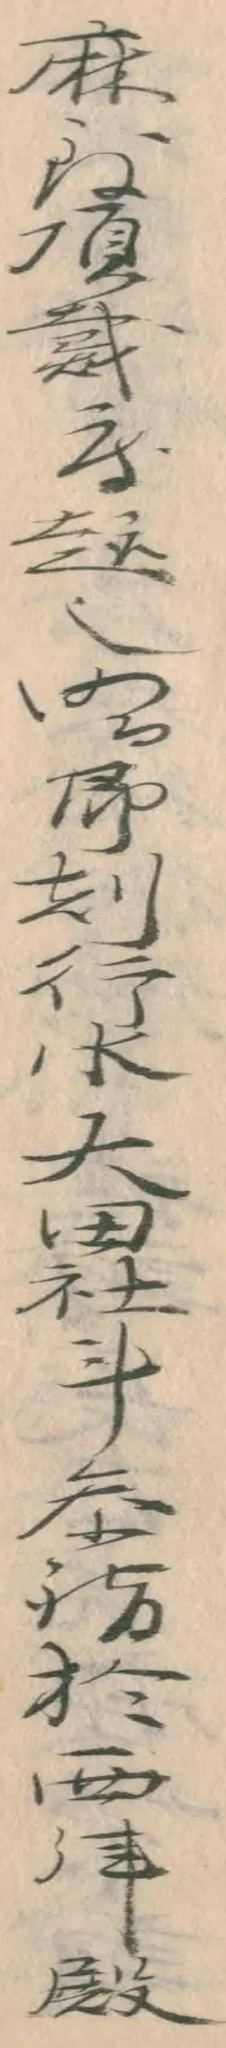麻致頂戴ニ付趣也仍而即刻行水大田社斗参詣於西拝殿
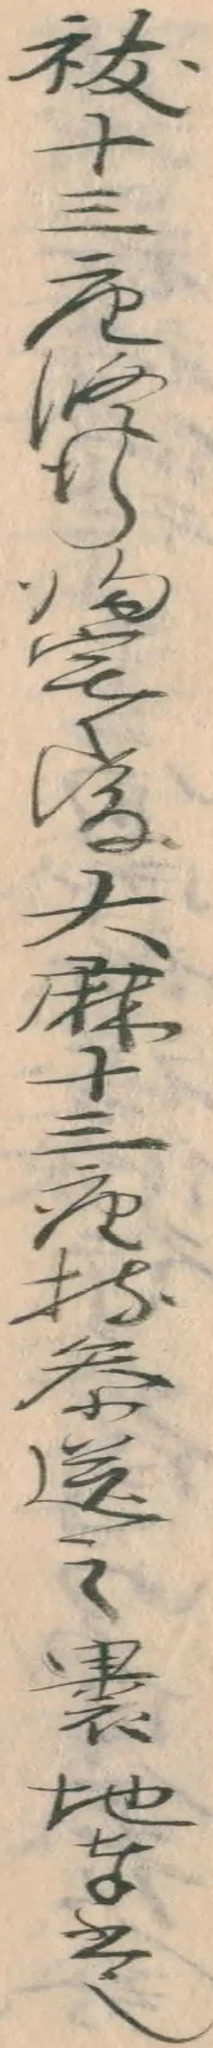祓十三座修行帰宅之後大麻十三座持参送之累地奉書之
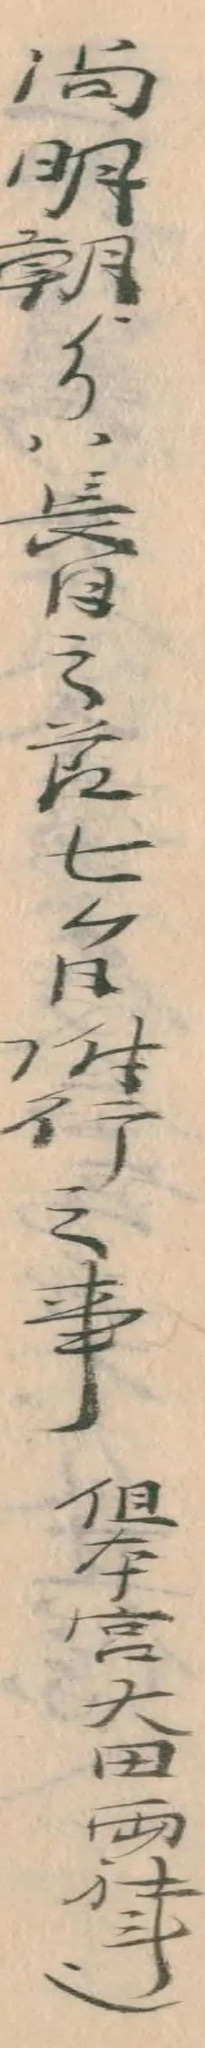尚明朝よりは長日之節七ケ日附行之事但本宮大田両社斗也
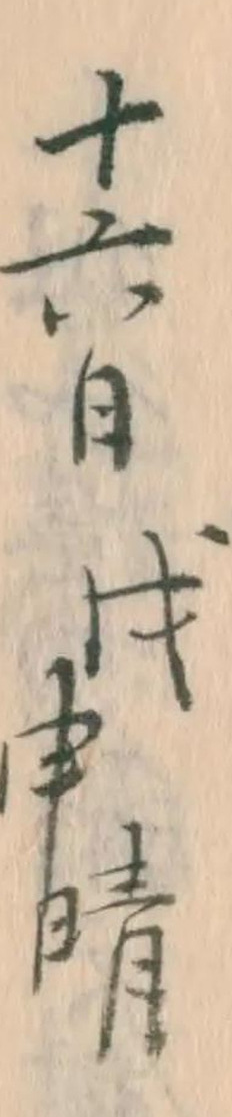十六日戊申晴
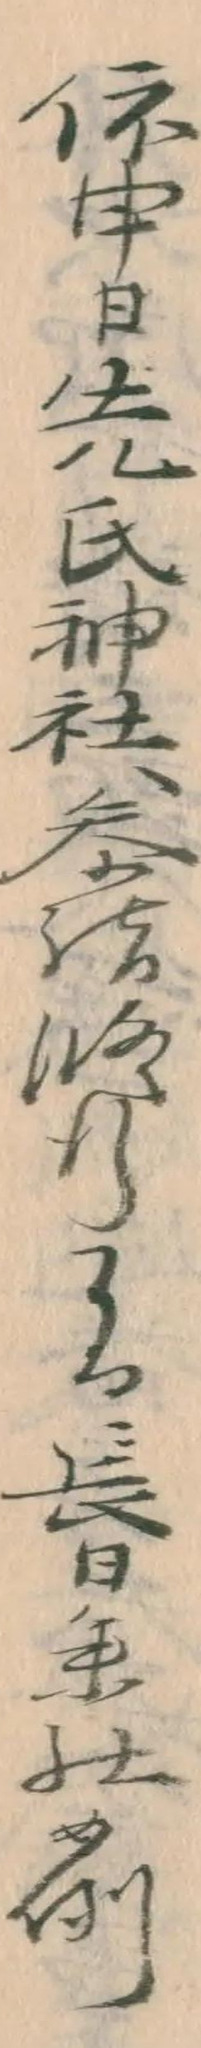一依申日先氏神社へ参詣修行了而長日参社如例
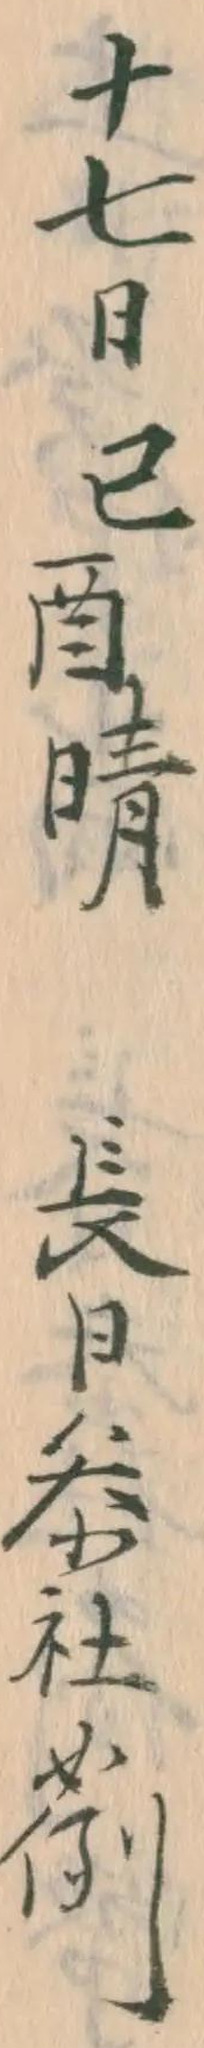十七日己酉晴長日参社如例
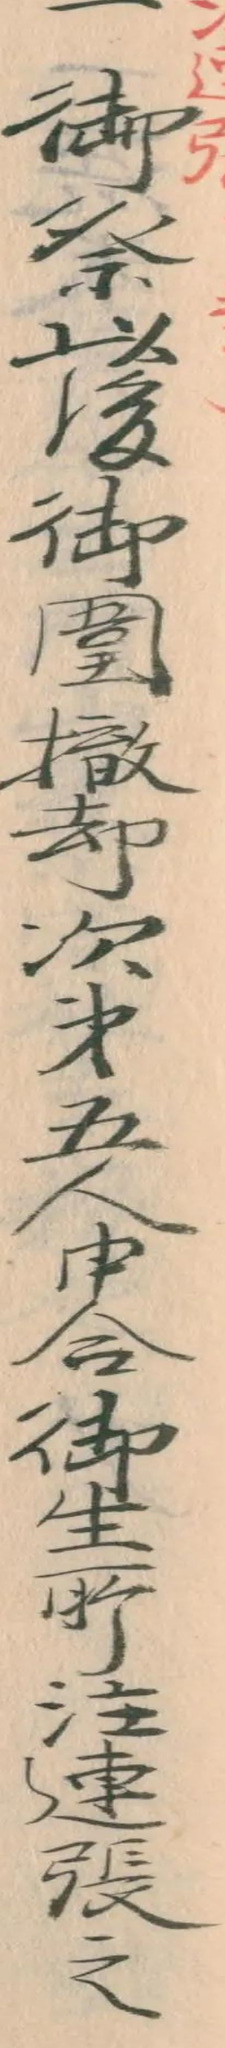一御祭以後御圍撒却次第五人申合御生所注連張之
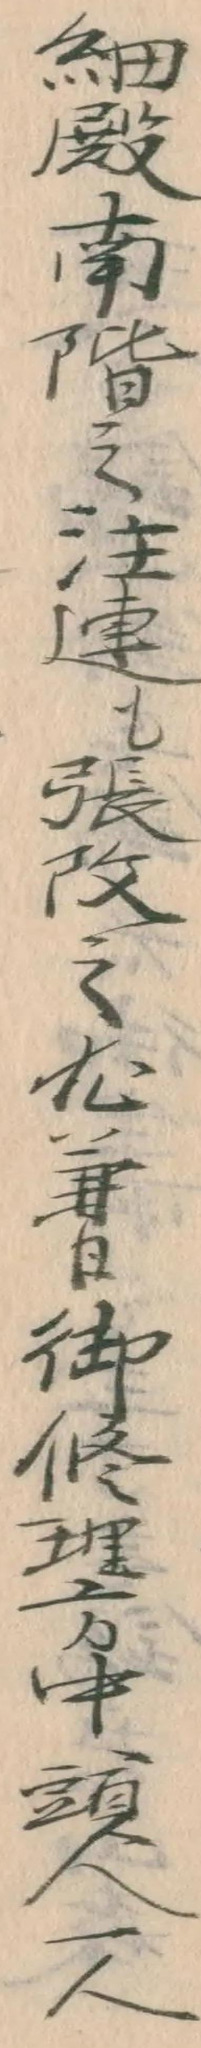細殿南階之注連も張改之尤兼日御修理方中へ頭人一人
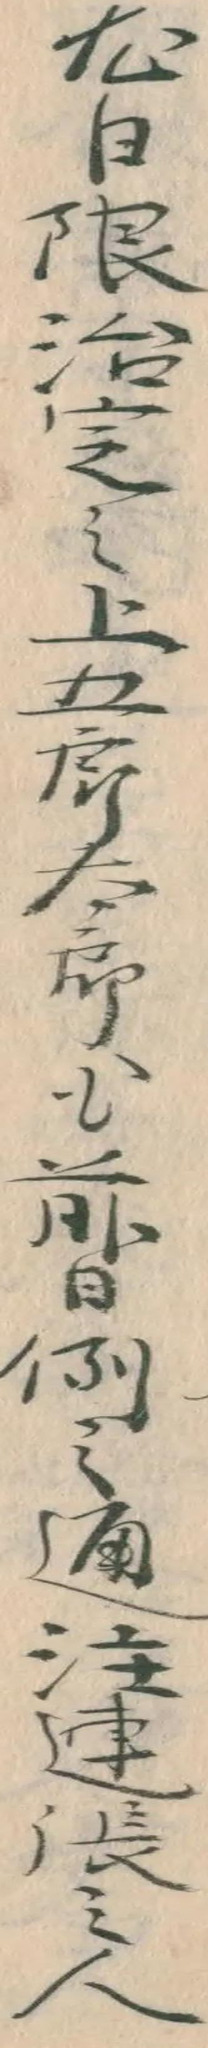尤日限治定之上五郎太郎へも前日例之通注連張之人
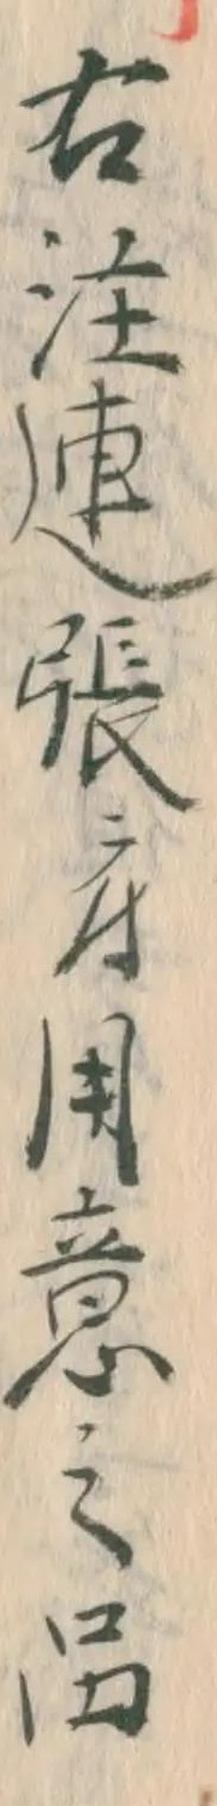右注連張ニ付用意之品

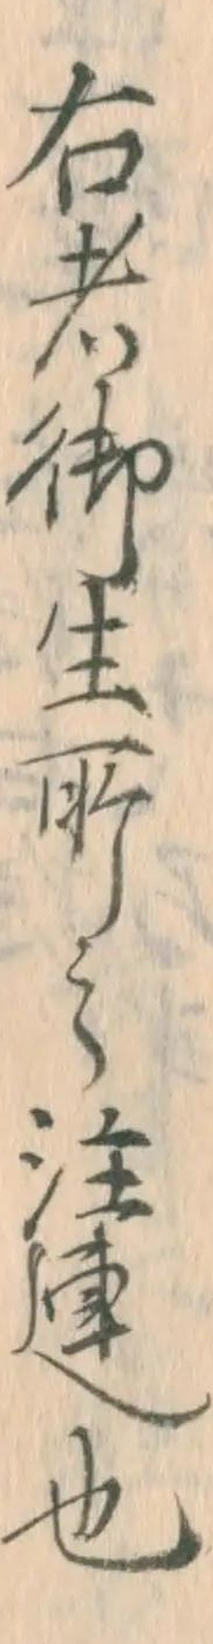右者御生所之注連也
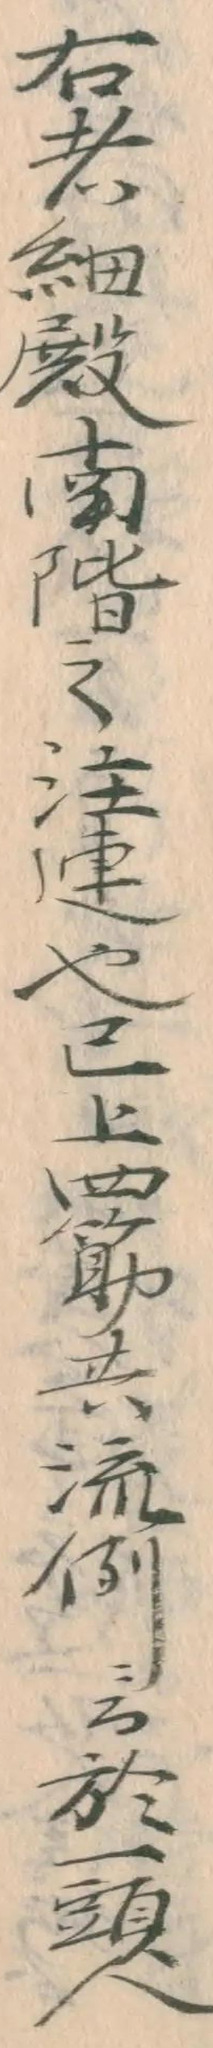右者細殿南階之注連也已上四筋共流例ニ而於一頭人
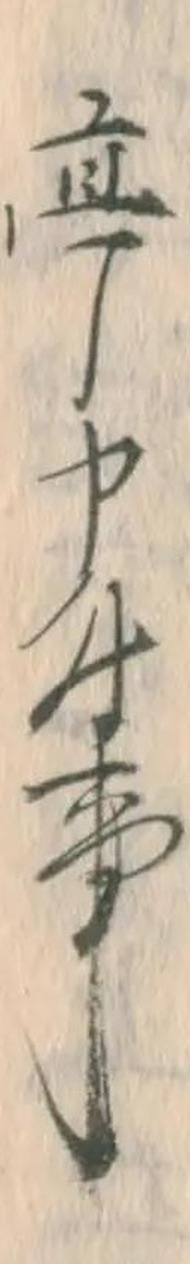亭申付事
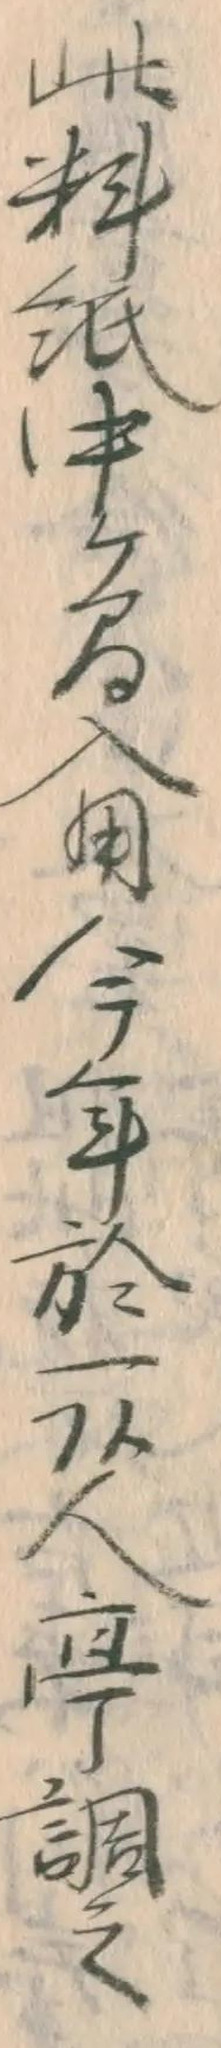此料紙中ヶ間入用今年於一頭人亭調之
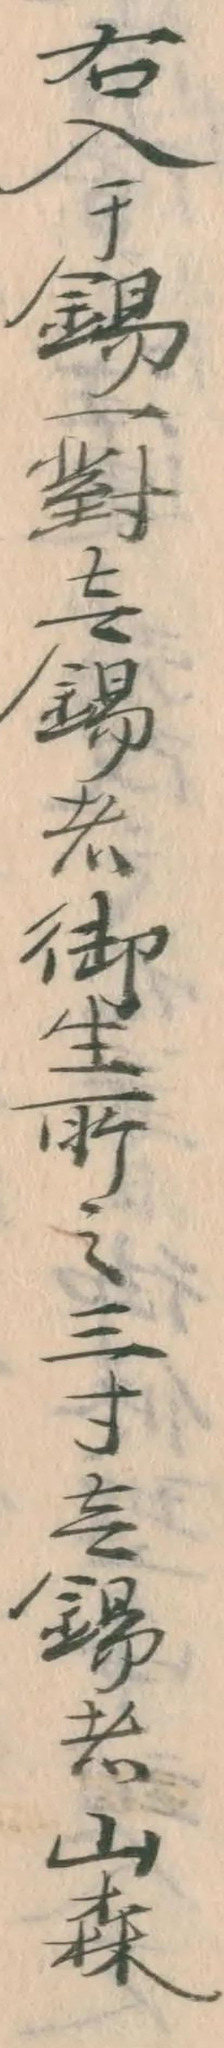右入干錫一對壱錫者御生所之三寸壱錫は山森
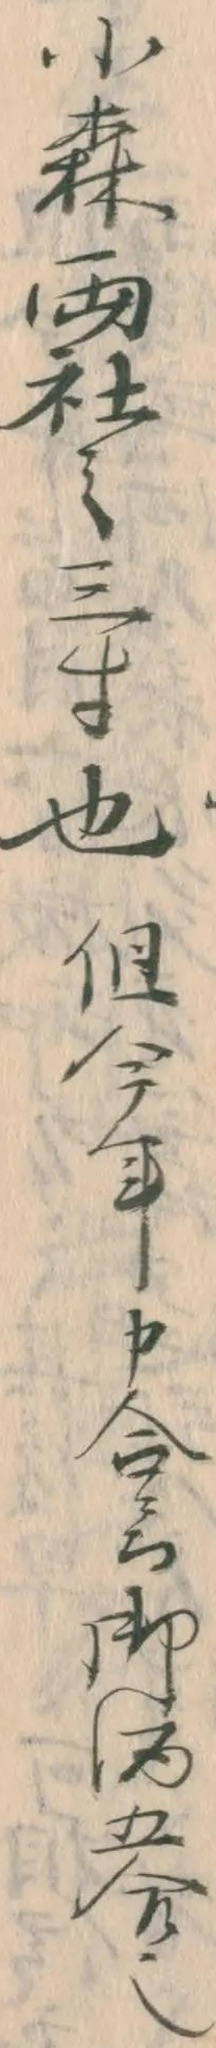小森両社之三寸也但今年申合ニ而御酒五合也
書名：賀茂社記録. 第73冊
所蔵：国立国会図書館 National Diet Library, JAPAN
